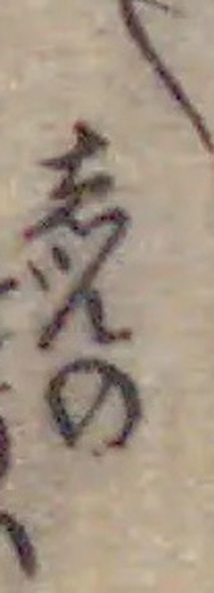しんの
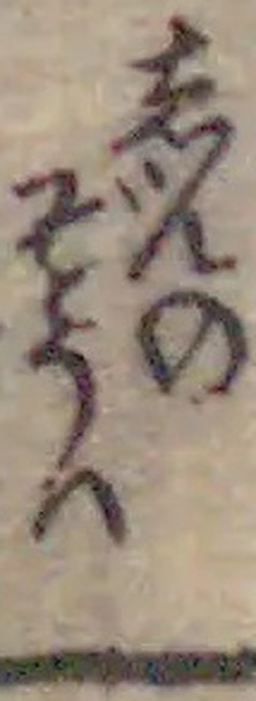ぞうは
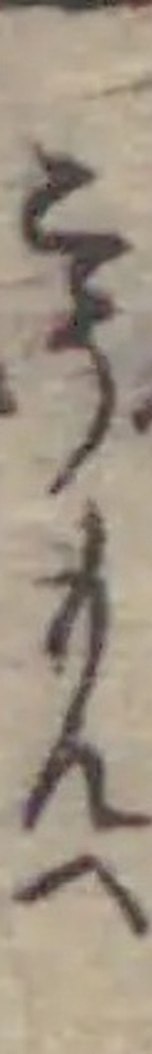こうもんへ
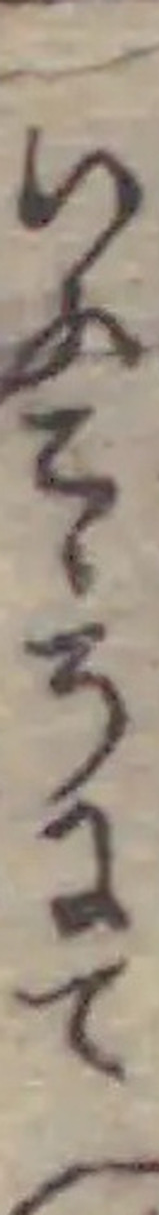いふこゝろにて
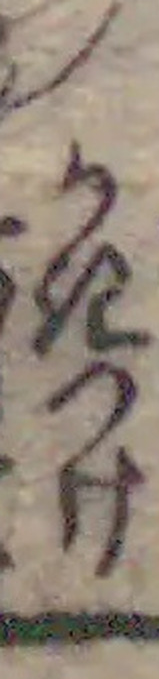かきつけ
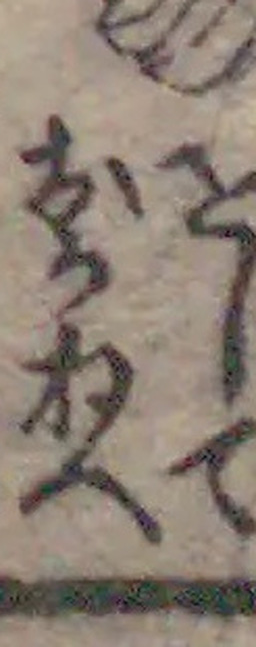おかねへ
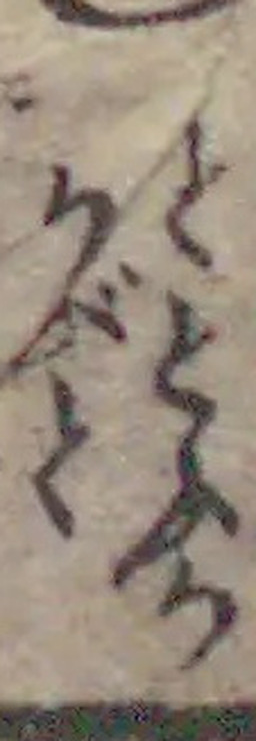かべと
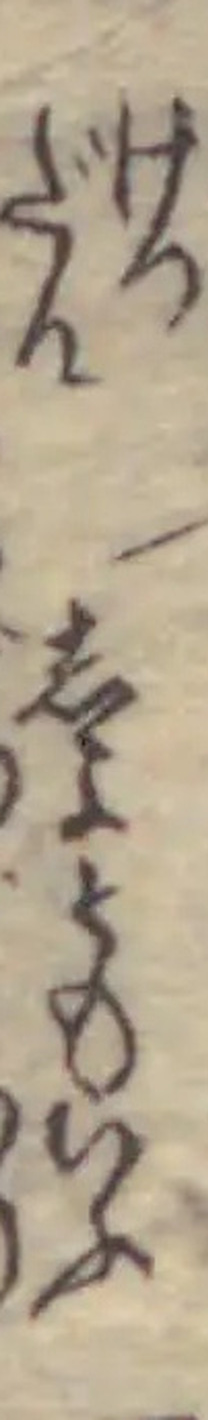だんしよともいふ
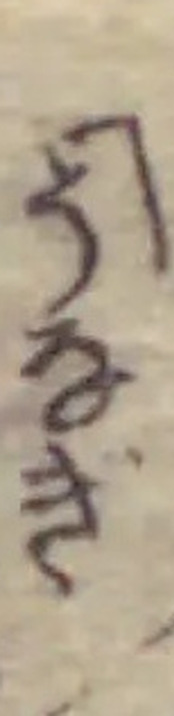〽うなぎ
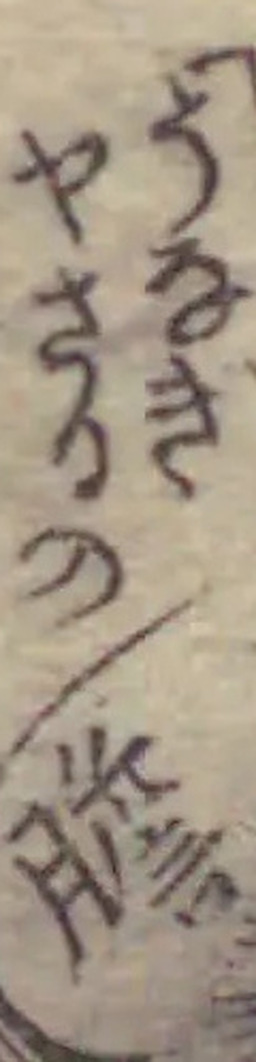やさるの
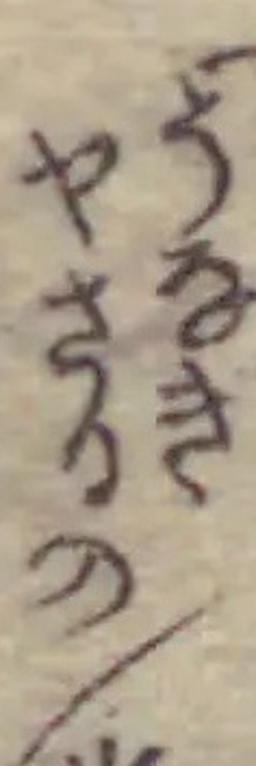やさるの
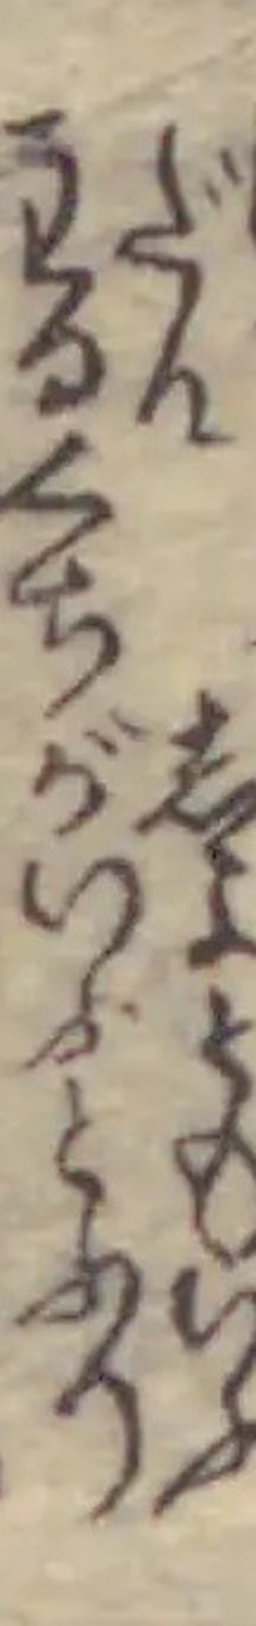わるくちがいふとふり
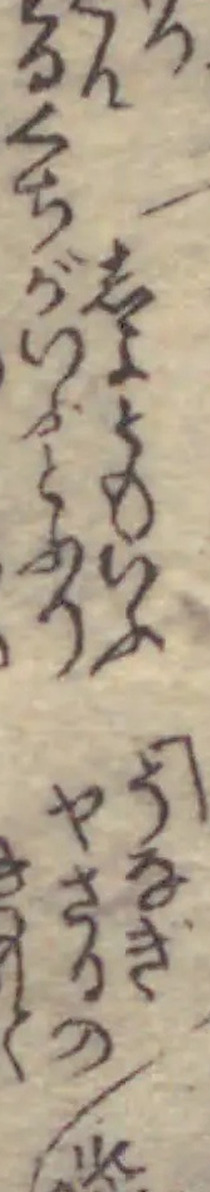わるくちがいふとふり
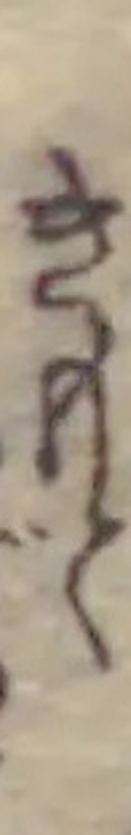きもと
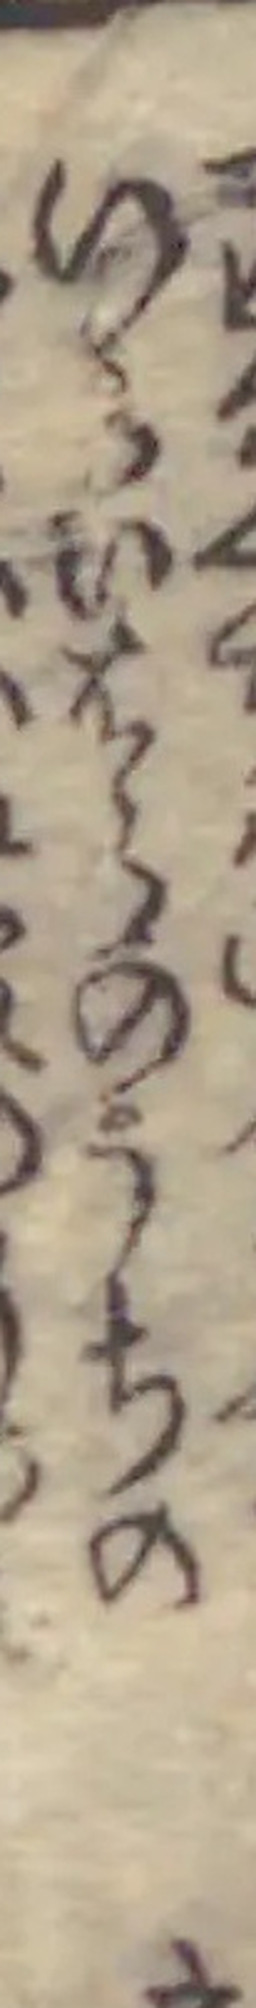いらいはらのうちの
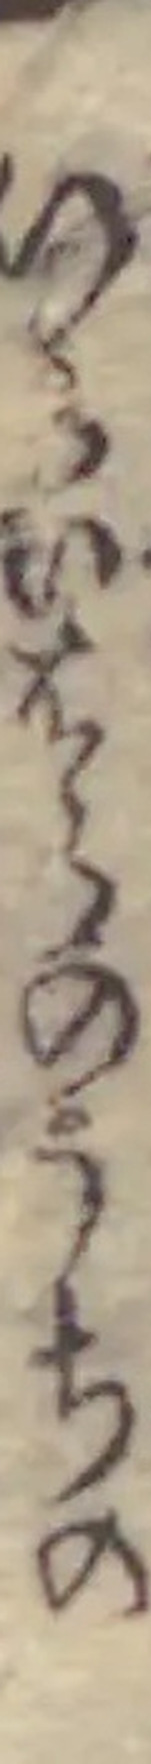いらいはらのうちの
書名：腹内養生主論 3巻
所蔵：国立国会図書館 National Diet Library, JAPAN
